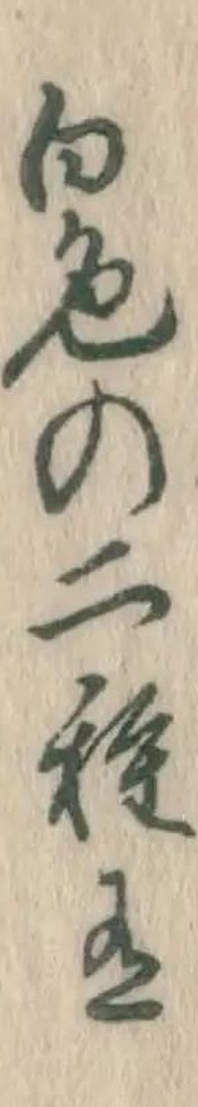白色の二種有
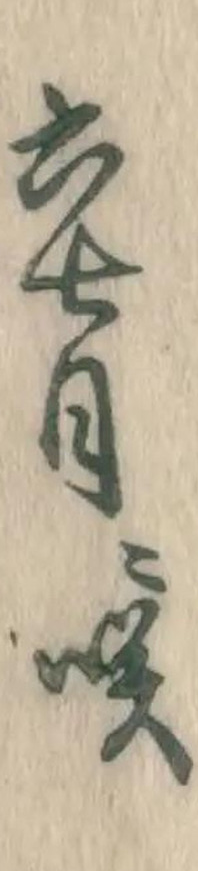六七月に咲

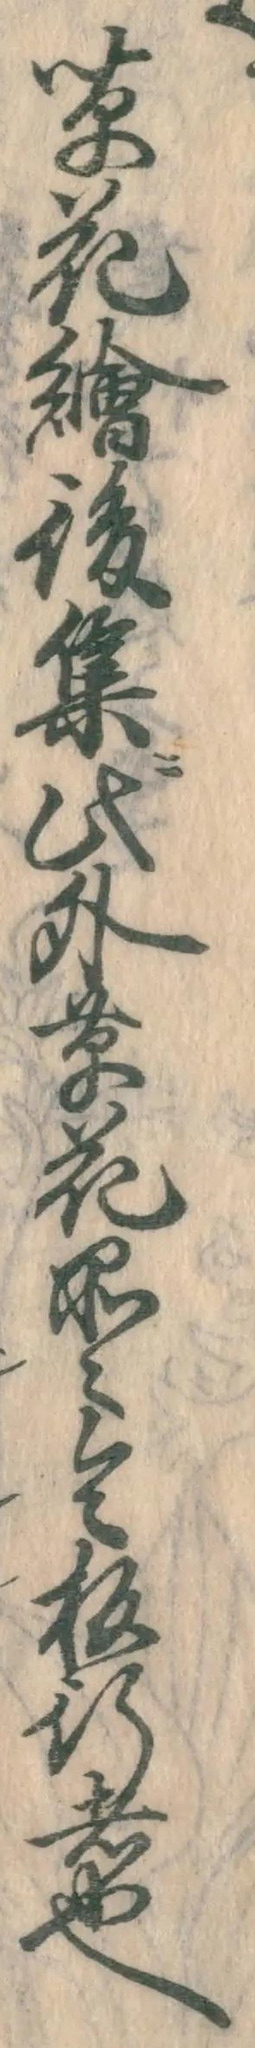草花絵後集に此外草花品々令板行者也
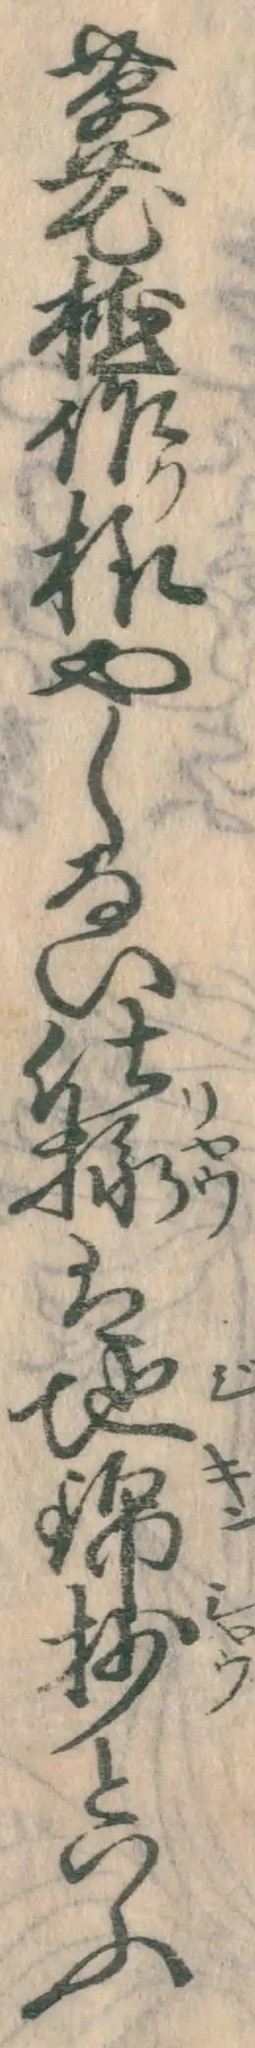草花植作り様やしない仕様は地錦といふ
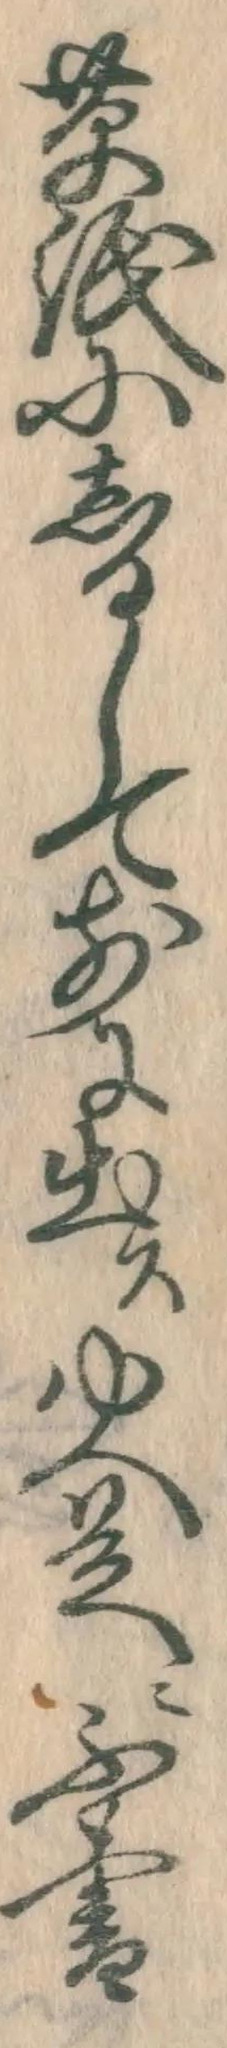草紙にしるして前に出すゆへ是に不書
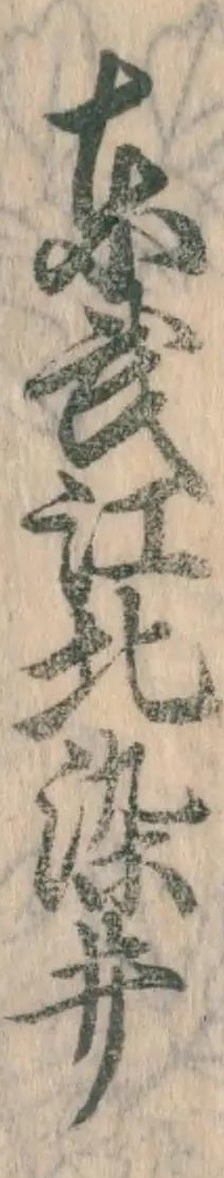東武江北染井
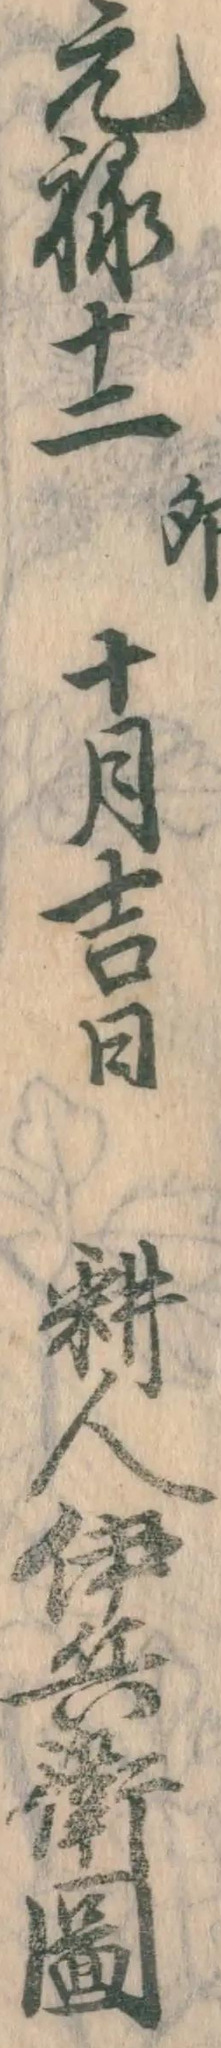元禄十二卯十月吉日耕人伊兵衛図
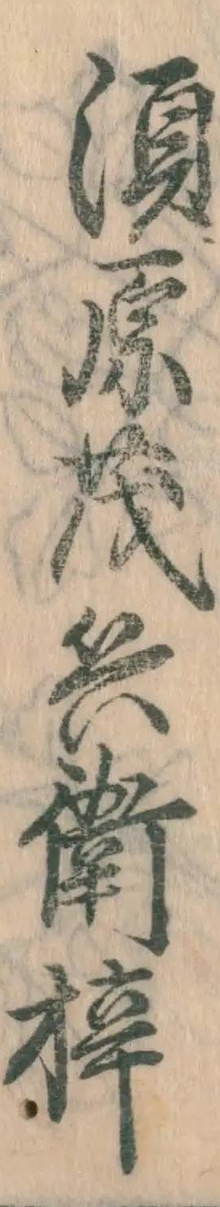須原茂兵衛梓
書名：艸花繪前集. [3]
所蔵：国立国会図書館 National Diet Library, JAPAN
